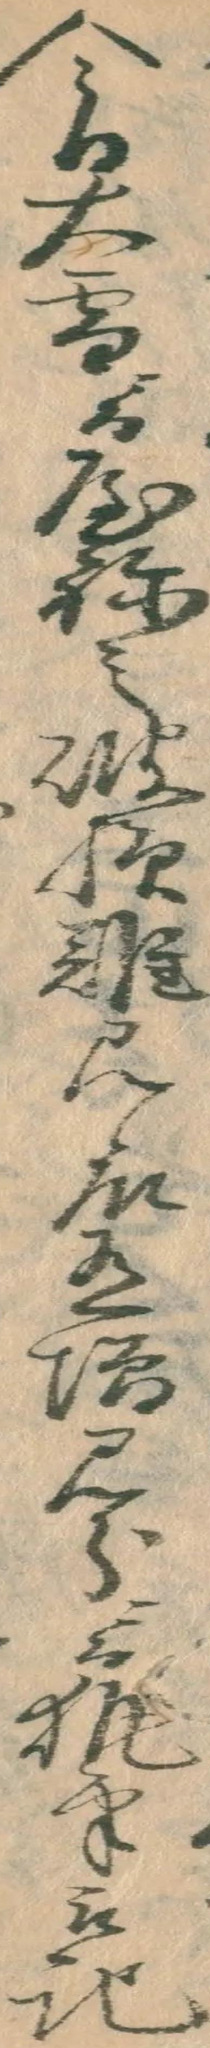今日大雪ニ而屋祢之破損難見候故有増見分ニ而執筆被記
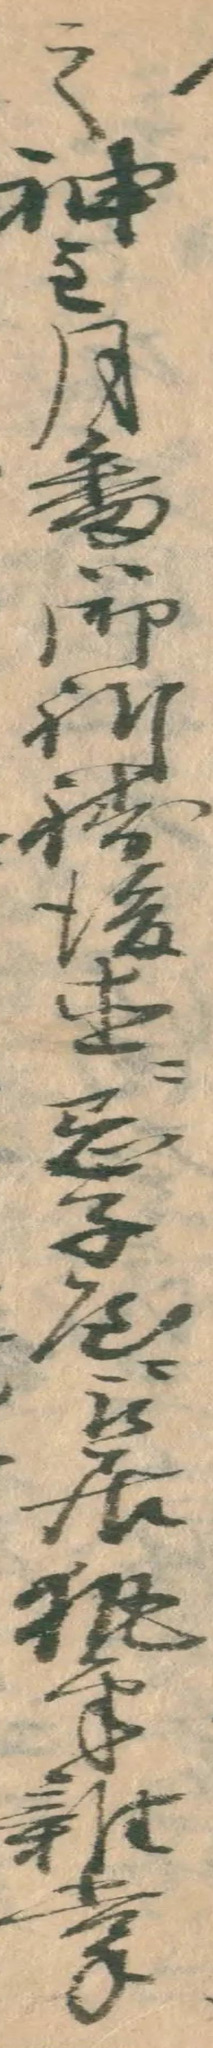之神主月番ハ御祈祷後直ニ忌子屋ニ被居執筆雑掌
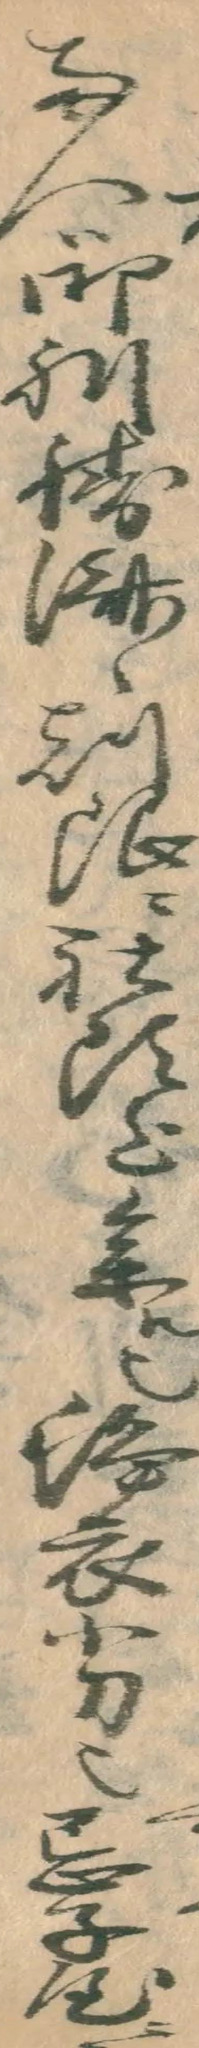両人ハ御祈祷済候刻限ニ社頭迄参ル也浄衣小刀也忌子屋ニ而
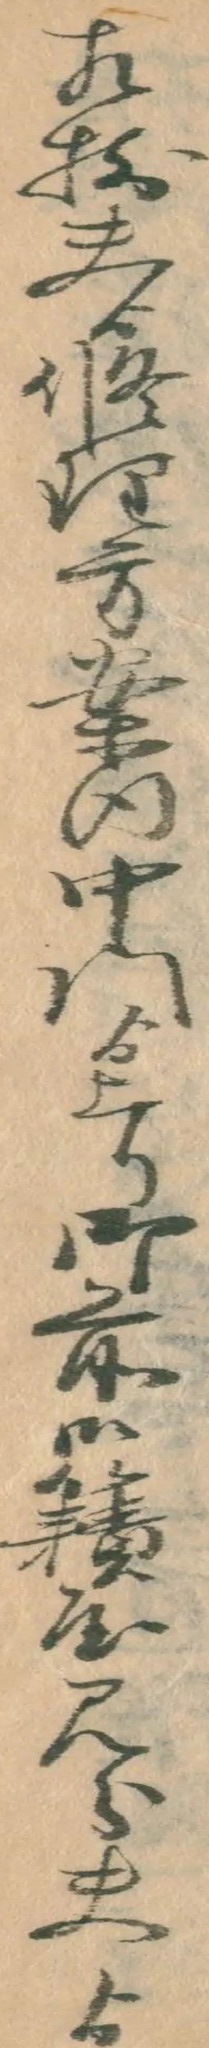相揃夫ゟ修理方案内中門ゟ上り御前御籍屋見分夫ゟ

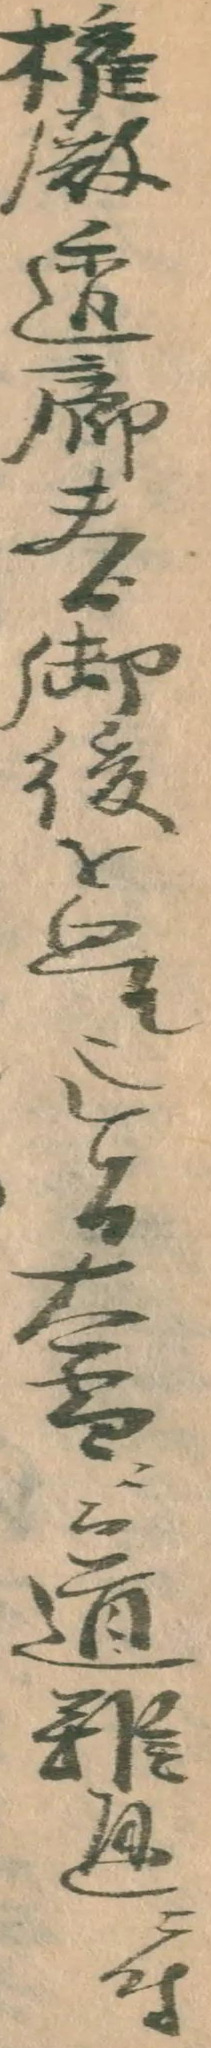権殿透廊夫ゟ御後を廻し也今日大雪ニ而道難通ニ付
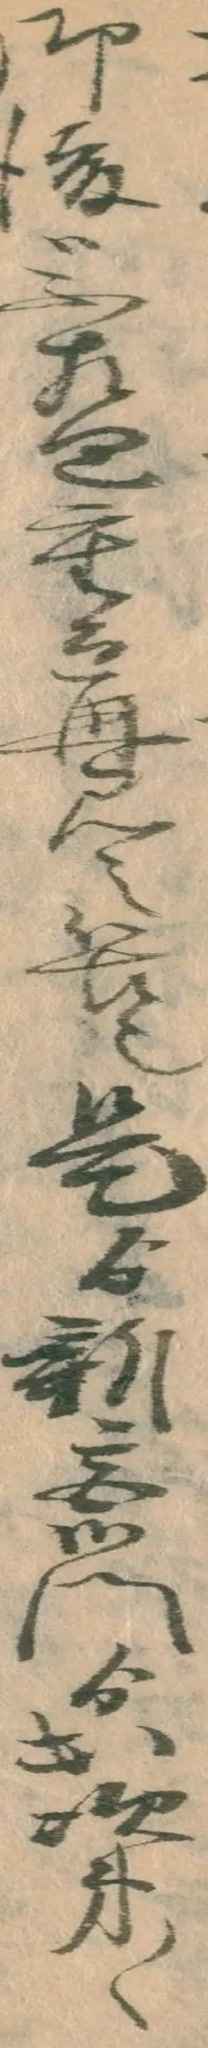御後ハ不相廻重而再見之筈也是ゟ新宮御門ゟ出次第〳〵
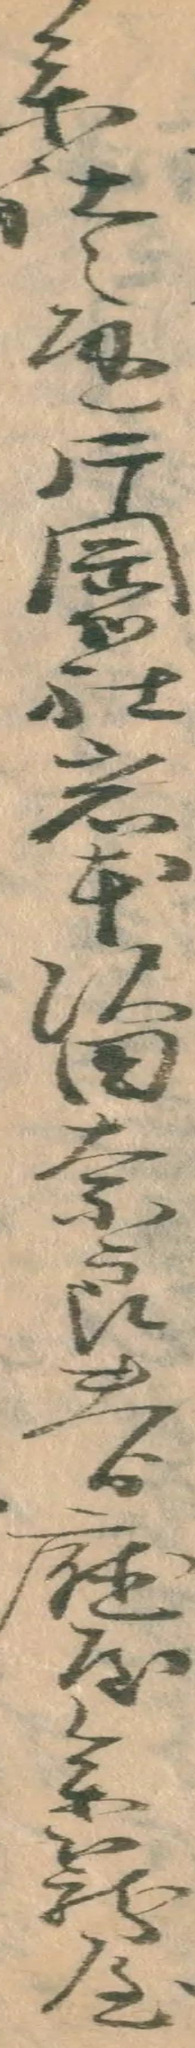参社之通片岡御社岩本沢田奈良夫ゟ庁屋参籠屋
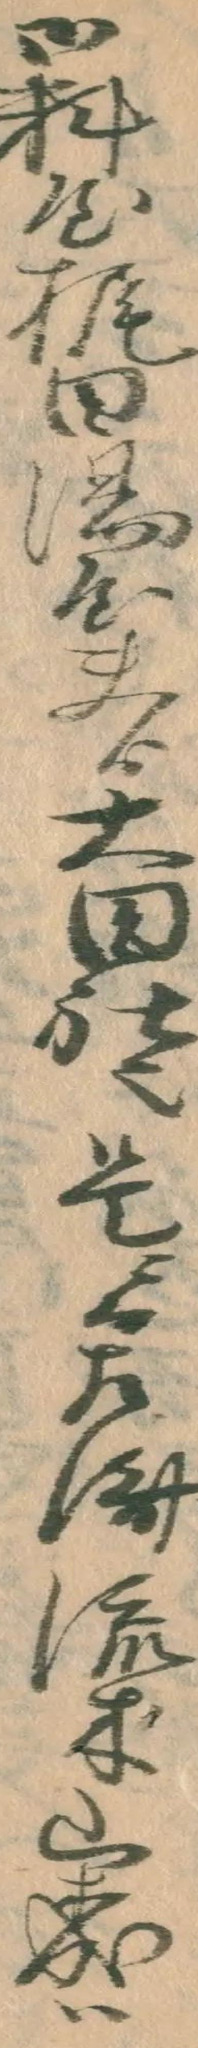御料屋梶田湯屋夫ゟ大田社也是ニ而相済流木山森ハ
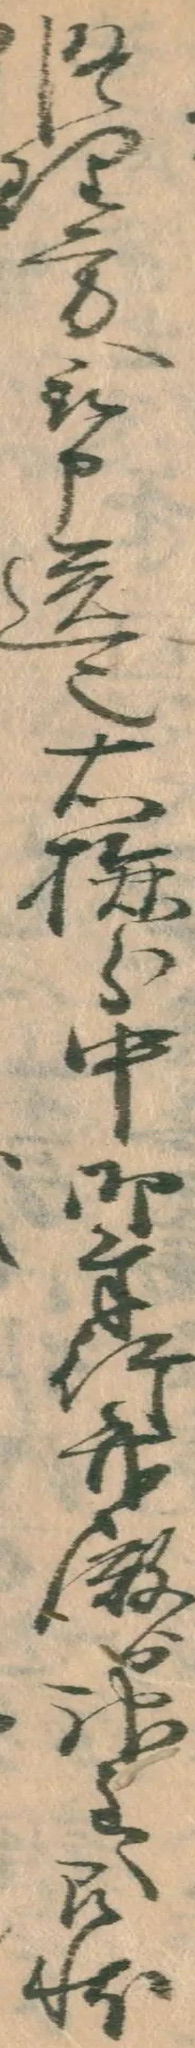修理方へ被申送也右検分中御奉行竹殿ゟ神主へ召状
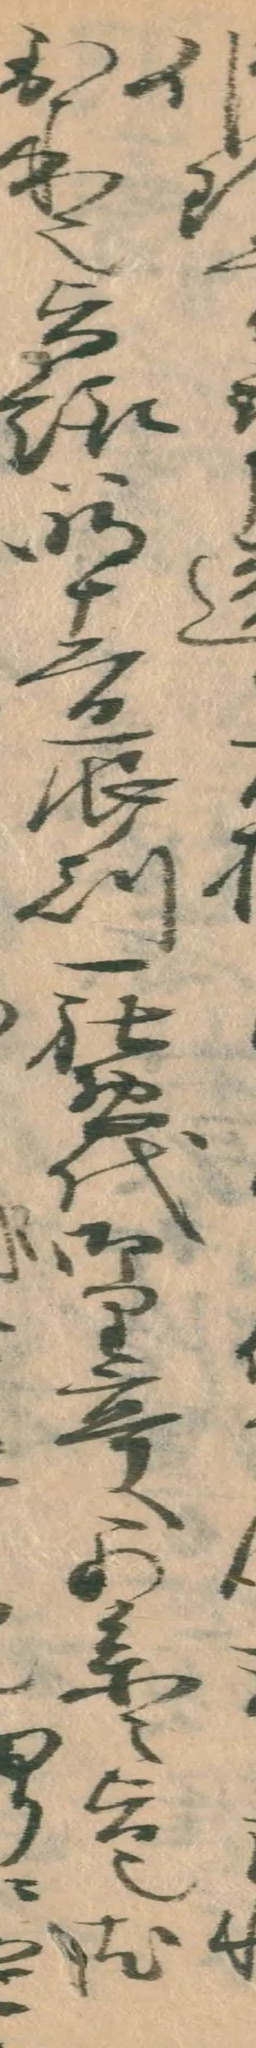到来也旨趣ハ明十二日辰ノ刻一社惣代御里亭へ可参之旨也尤
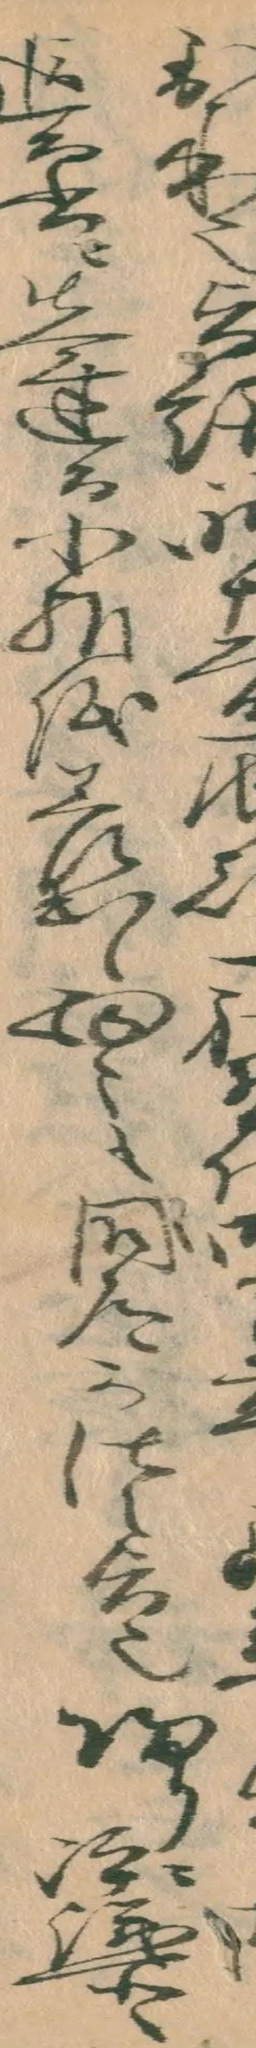追而書ニ先達而小折紙差出候面々も同道可仕之旨也帰りニ評議所へ
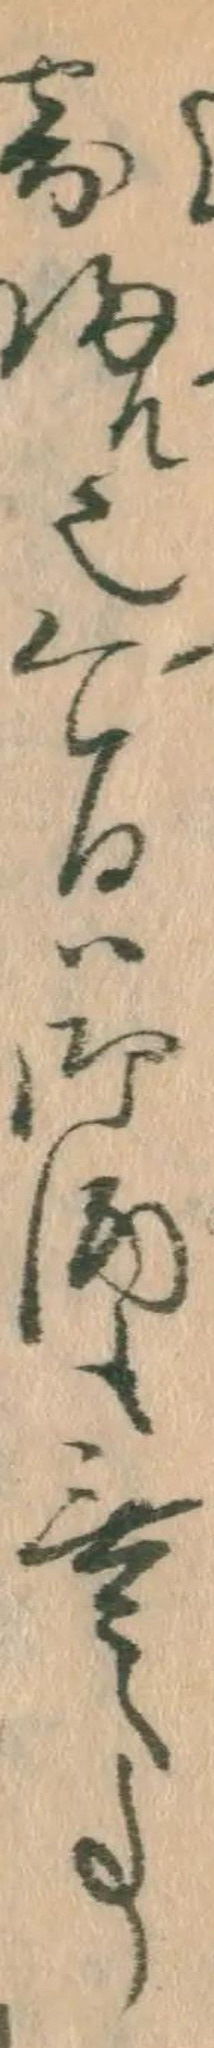寄帰ル也今日ハ御酒も無之事
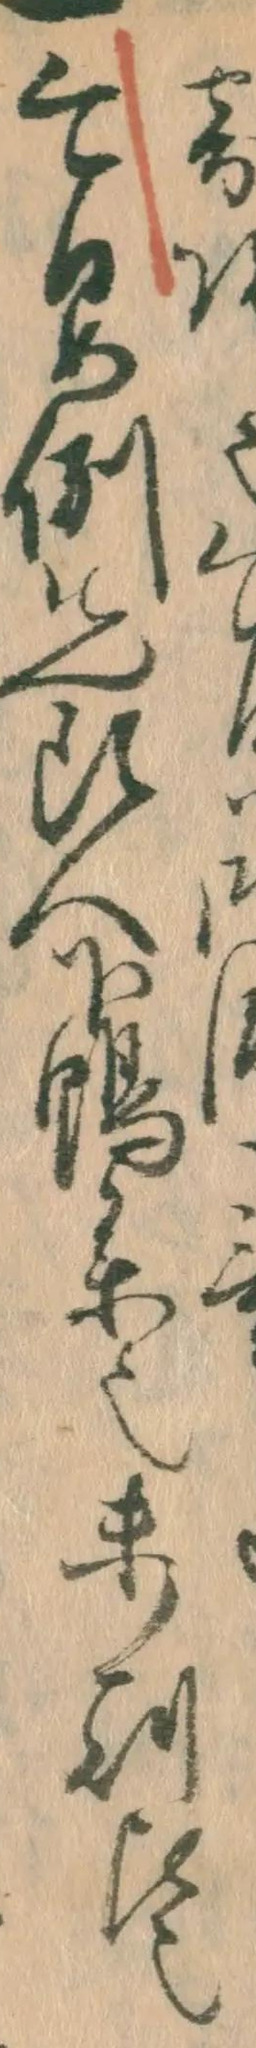一今日如例先頭人下鴨参也未ノ刻頃也
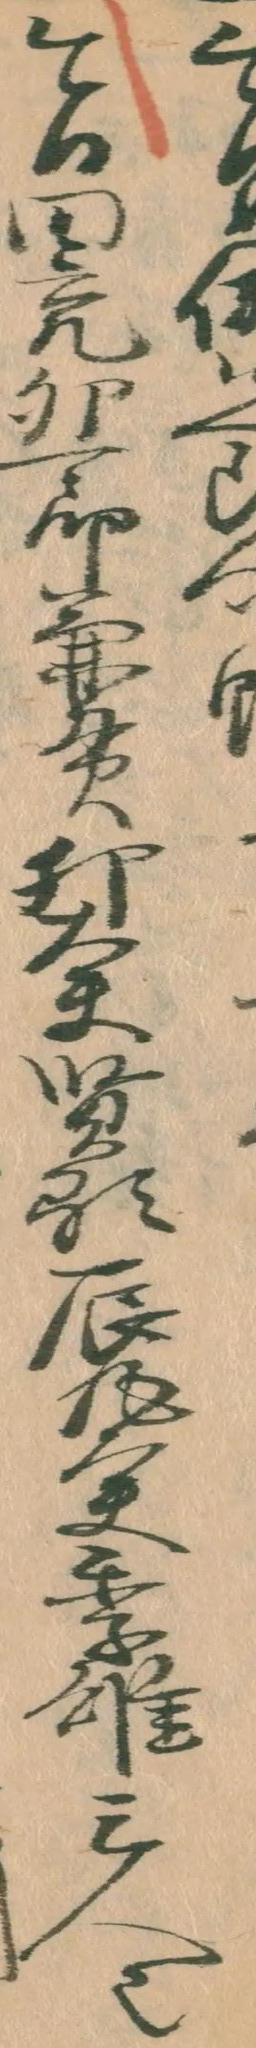一今日田充卯一郎兼貫卯大夫賢顕辰丸大夫季雄三人也
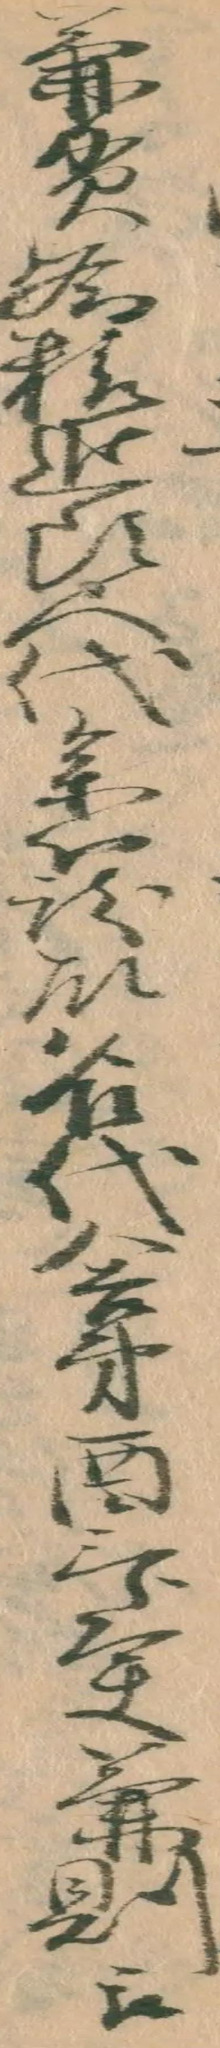兼貫為精進頭人代参籠故名代舎弟酉三郎大夫兼則被
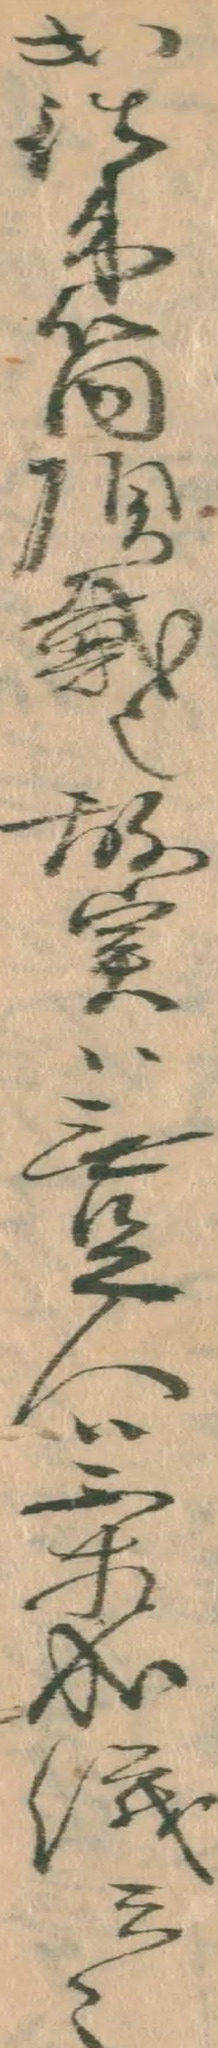出往来簡頂戴也故実ハ無足人ハ不相成儀云々
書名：賀茂社記録. 第60冊
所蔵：国立国会図書館 National Diet Library, JAPAN
